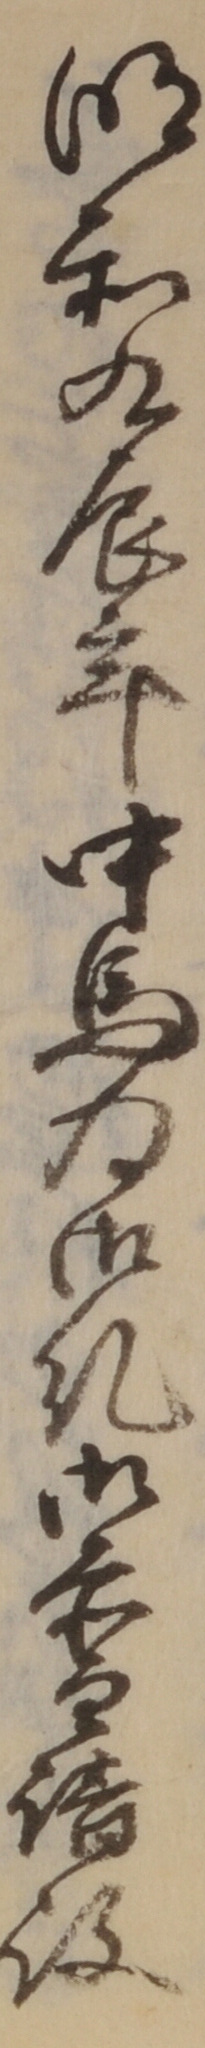明和九辰年中馬為御糺御普請役
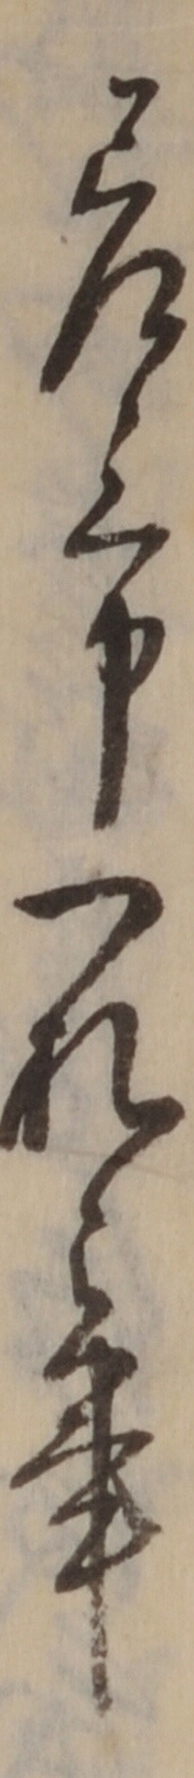差上申一札之事
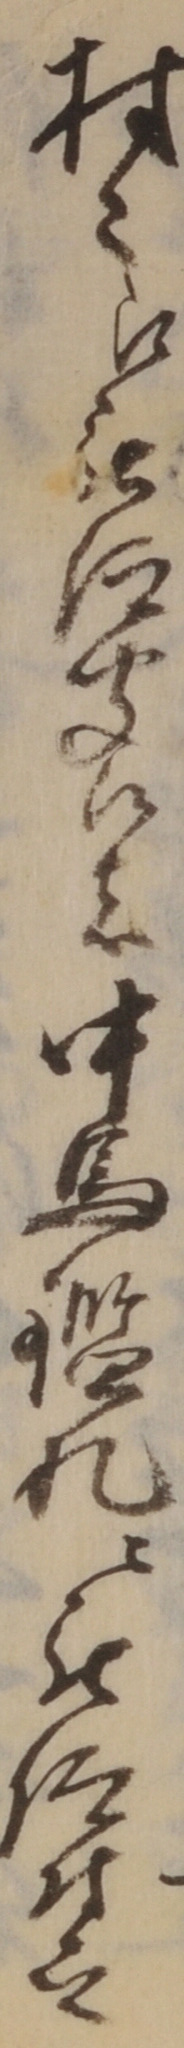村々え被仰聞候者中馬鑑札ニ被仰付候ハゝ
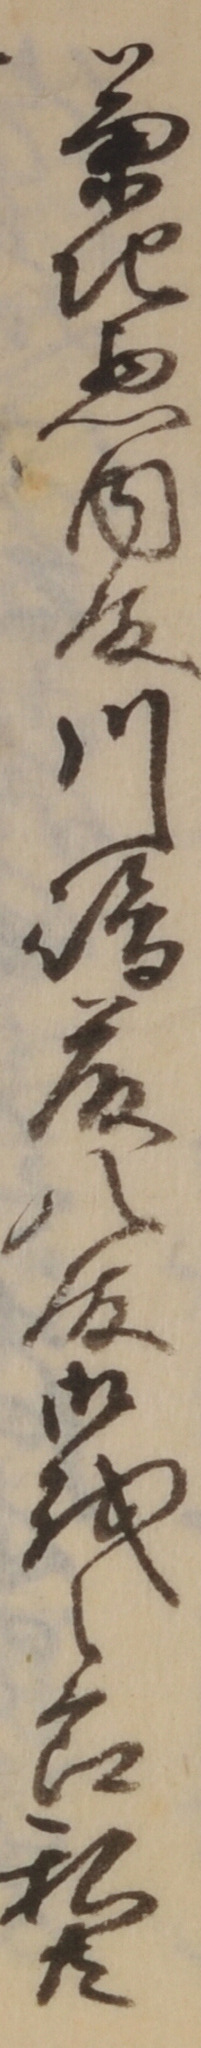菊地惣内殿川島藤八殿御越之節私共
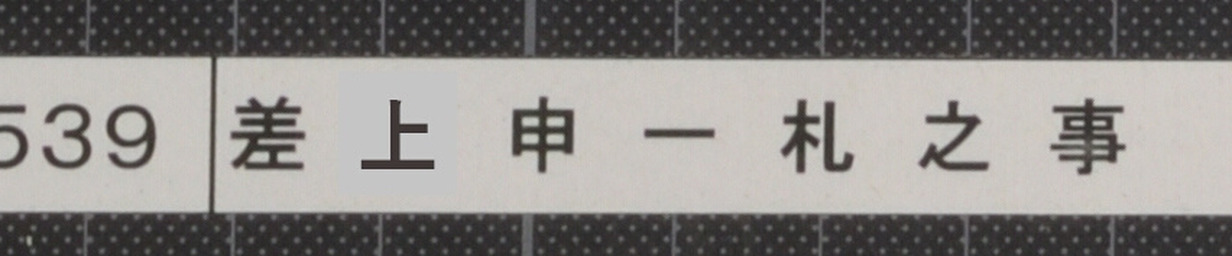差上申一札之事
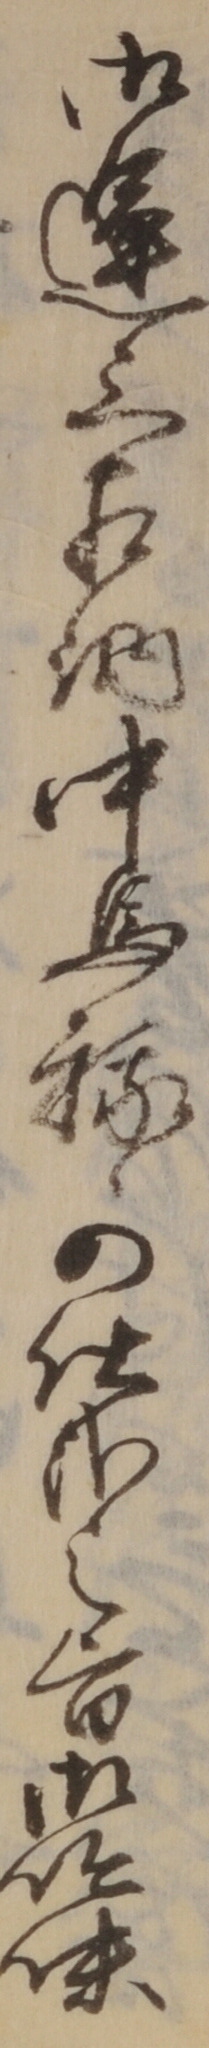御運上相納中馬稼可仕弐之旨御吟味
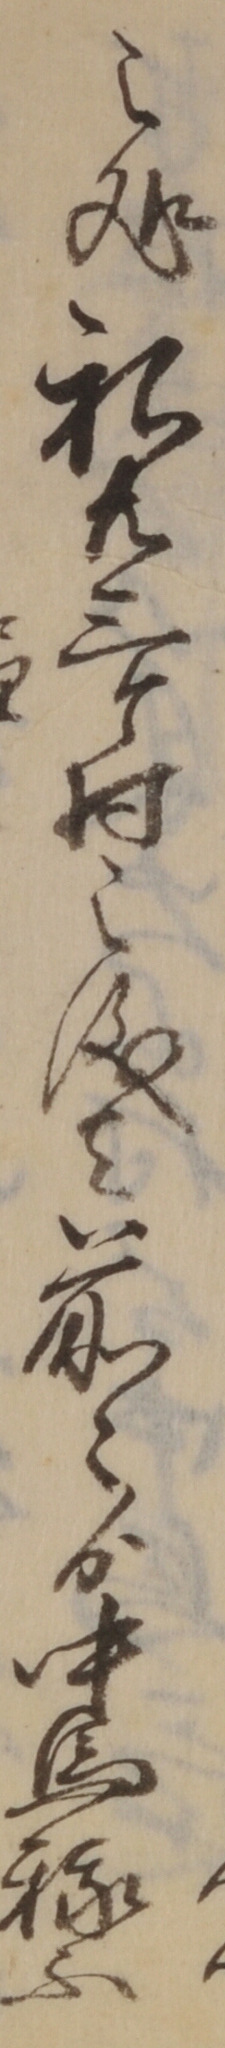之処私共三ヶ村之儀者前々より中馬稼不
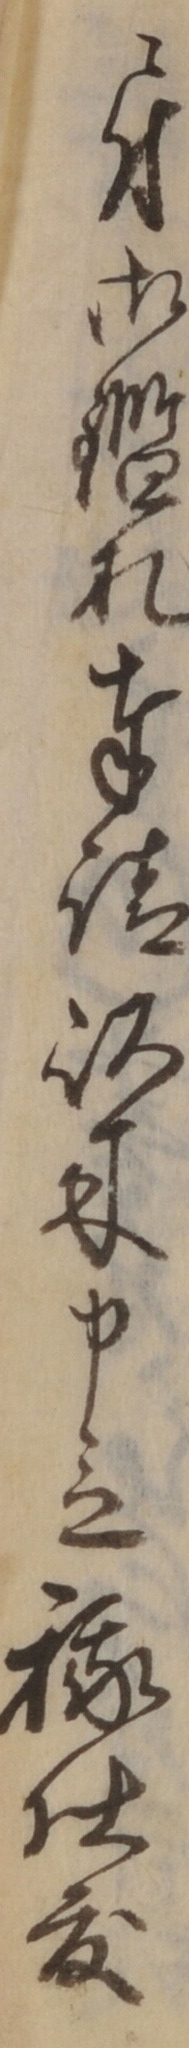ニ付御鑑札奉請以来申立稼支度
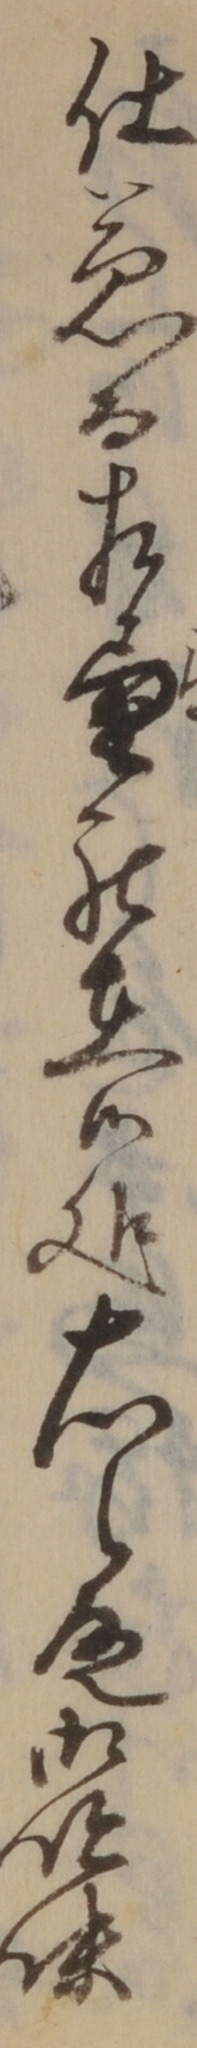仕兼而相望罷在候処右之故御吟味

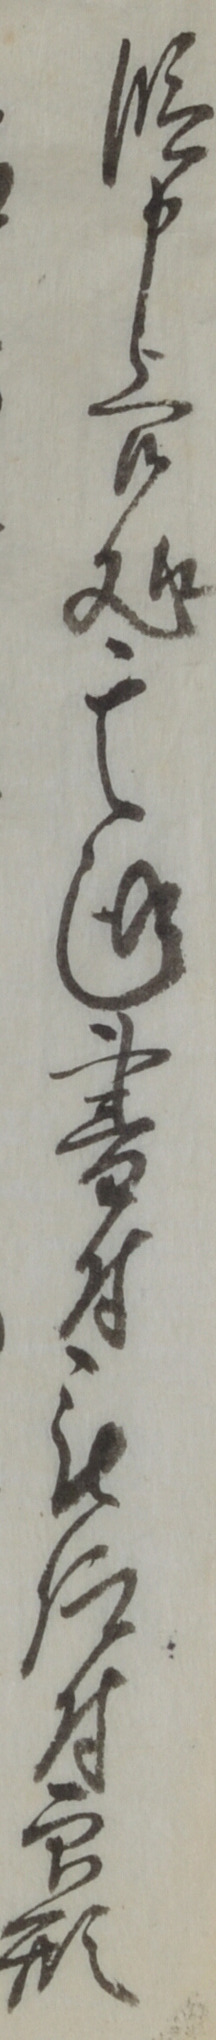段申上候処其趣書付被仰付印形
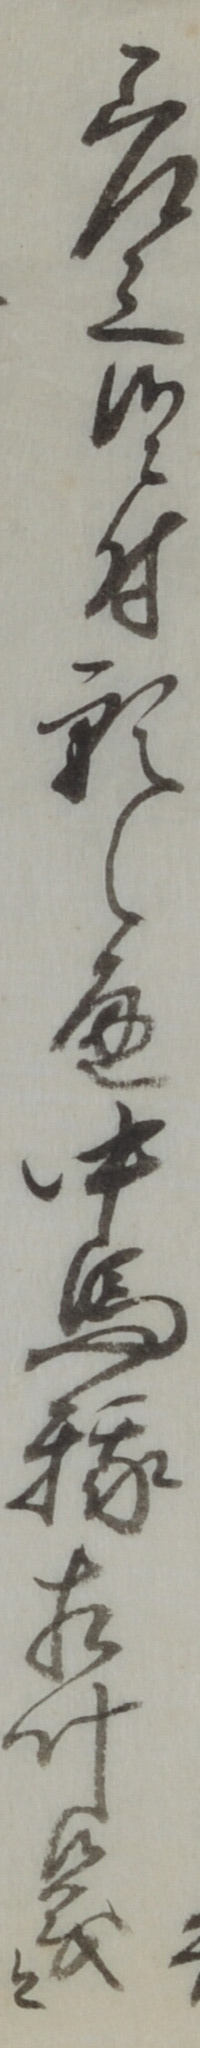差上候ニ付願之通中馬稼相叶候義と
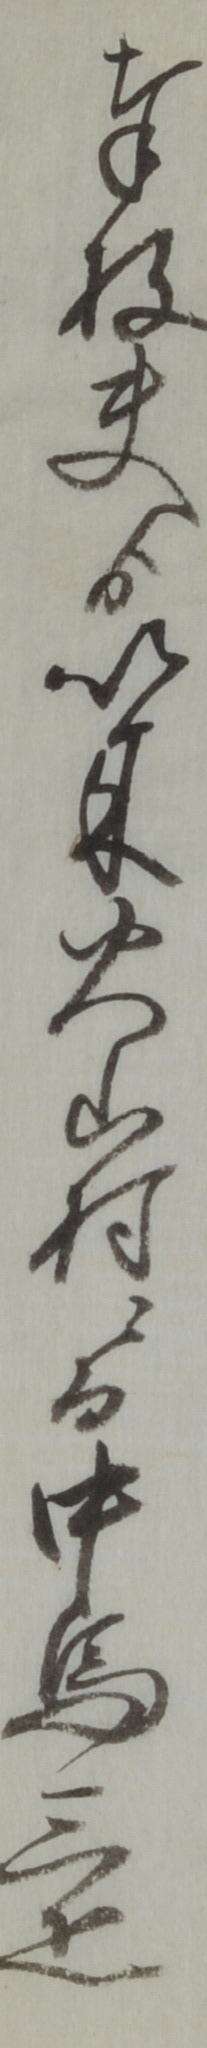奉存夫より以来火山村ニ而中馬三疋
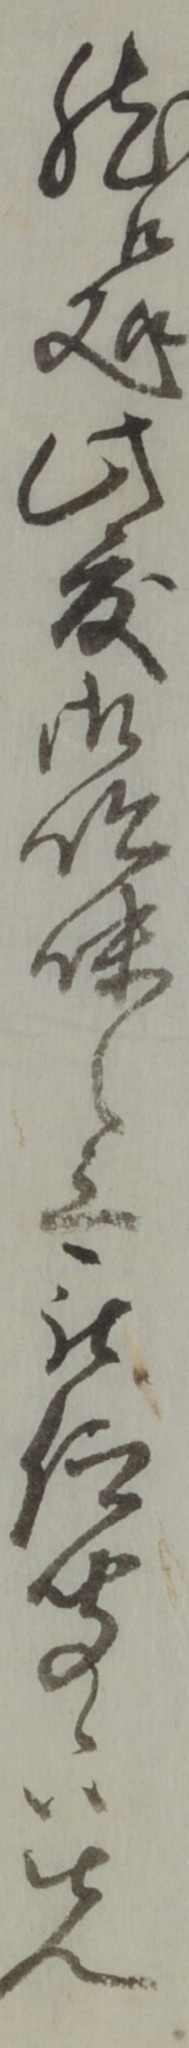然ル処此度御吟味之上被仰聞候ハ先
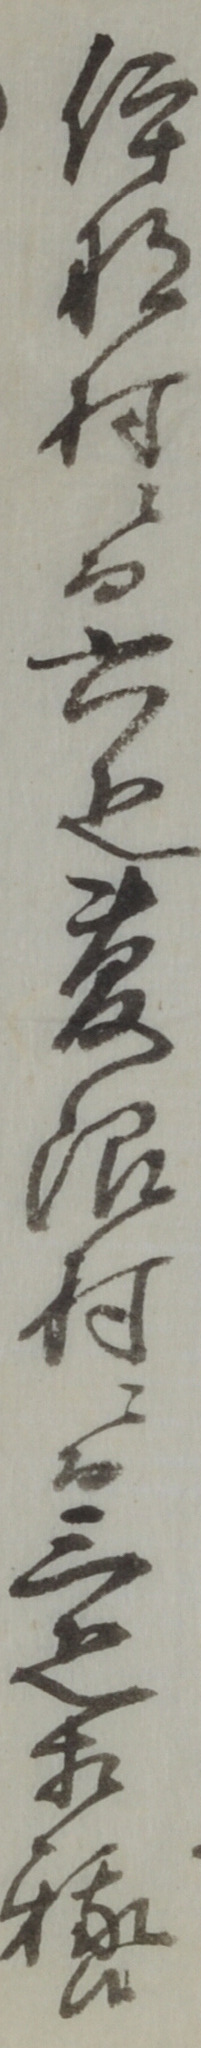伊那村ニ而六疋菅沼村ニ而三疋相稼候
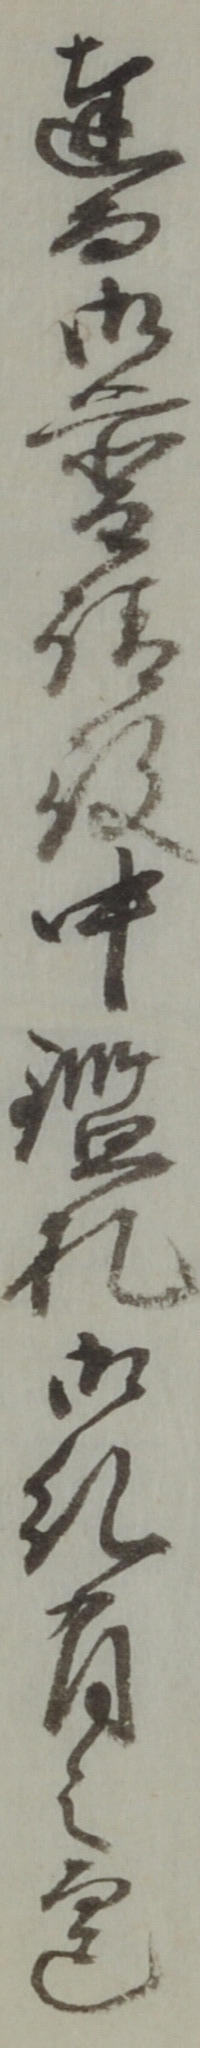達而御普請役中鑑札御糺有之而已
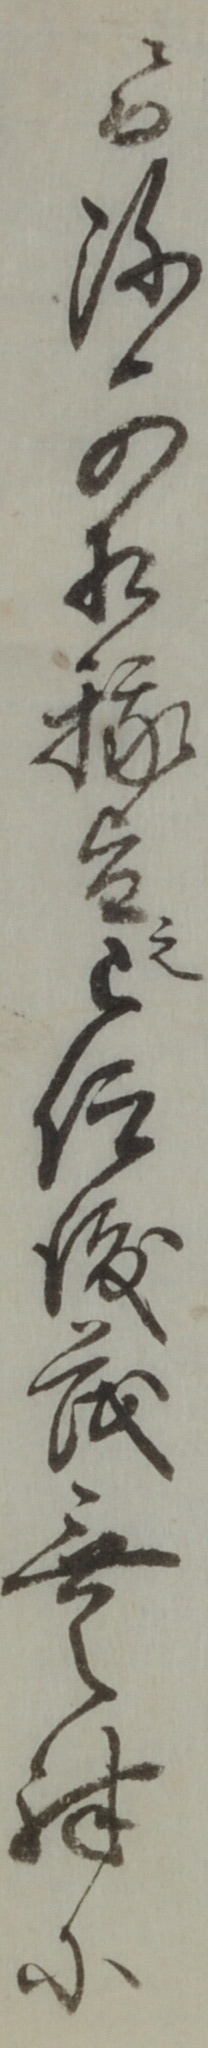ニ而弥可相稼旨之被仰後も無之殊に
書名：差上申一札之事
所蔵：伊那市立高遠町図書館・合同会社AMANE
